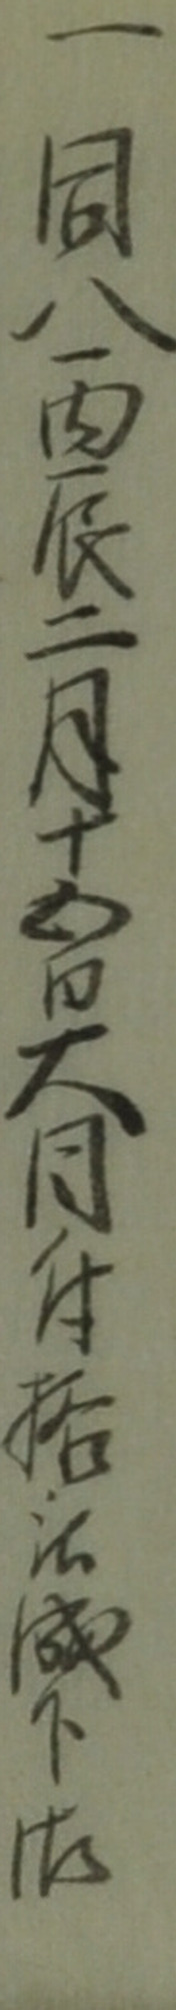一同八丙辰二月十五日大目付格被成下御
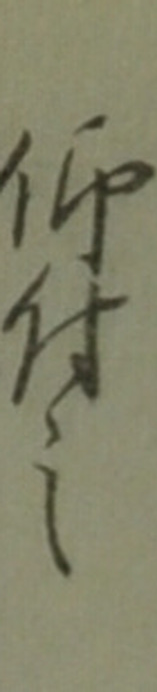仰付之
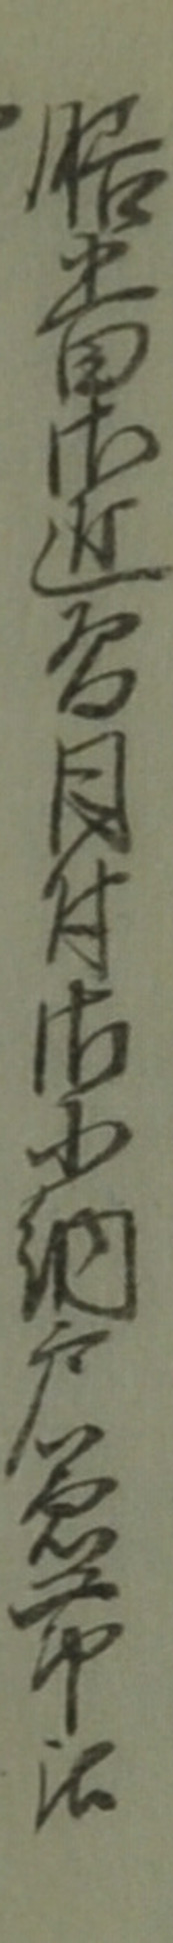膳番御近習目付御小納戸兼帯被
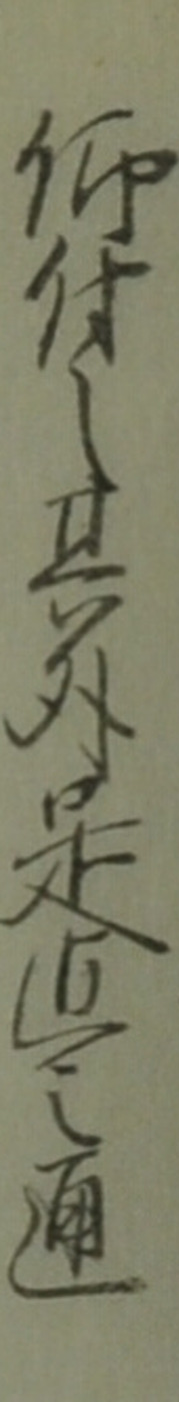仰付之其外是迄之通
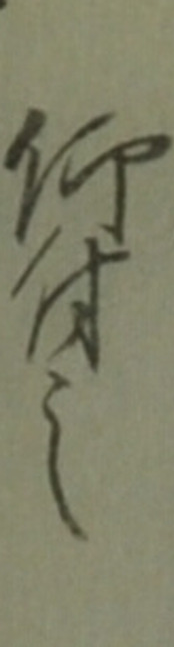仰付之
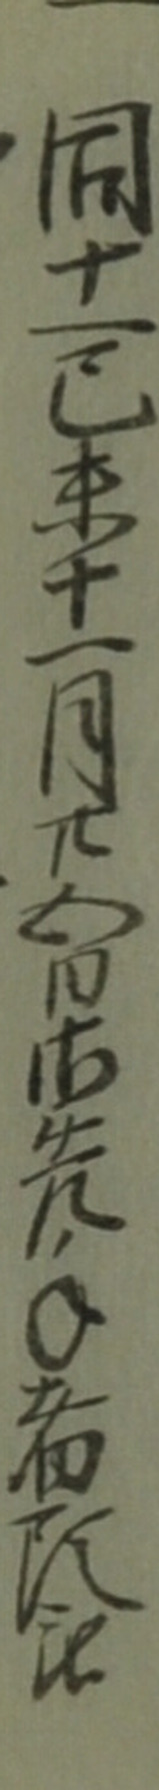一同十一己未十一月廿五日御先手者頭被
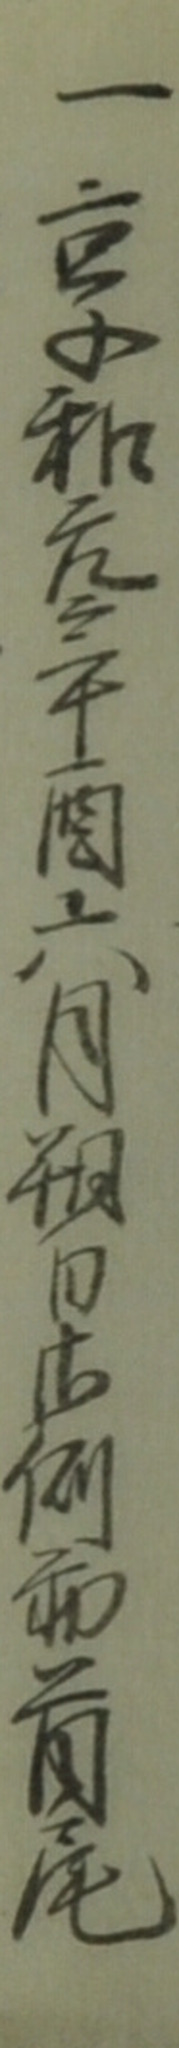一享和元辛酉六月朔日御側首尾
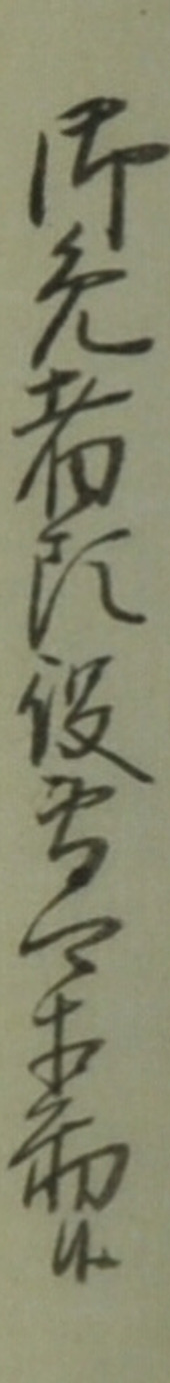能御免者頭役専可相勤候

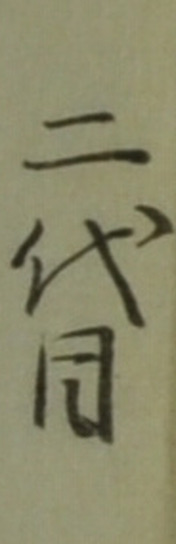二代目
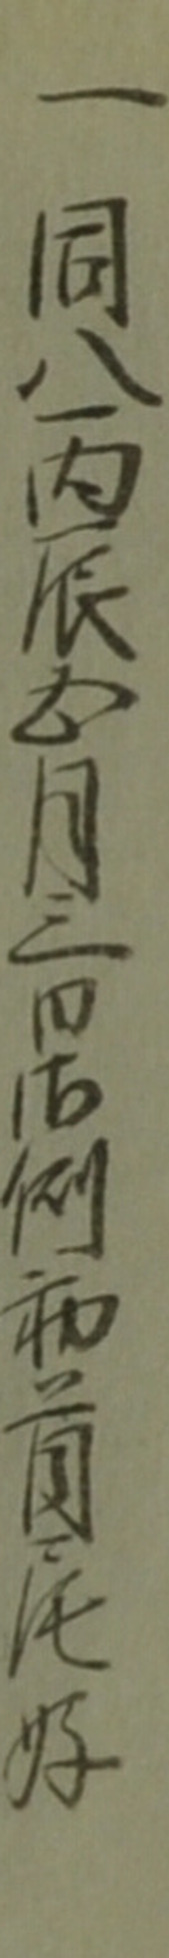一同八丙辰五月三日御側勤首尾好
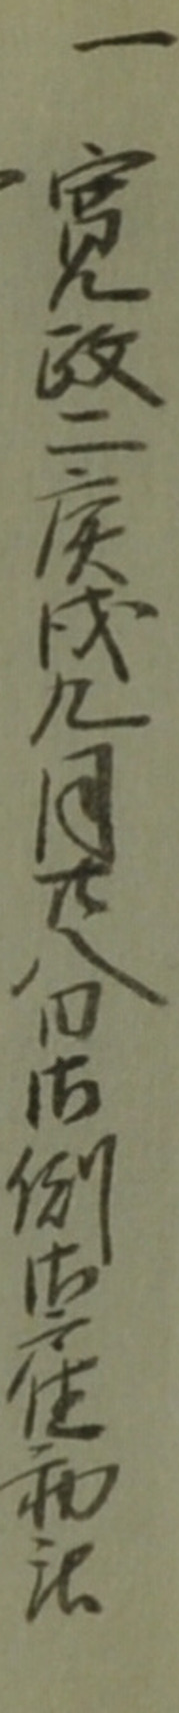一寛政二庚九月廿八日御側御雇勤被
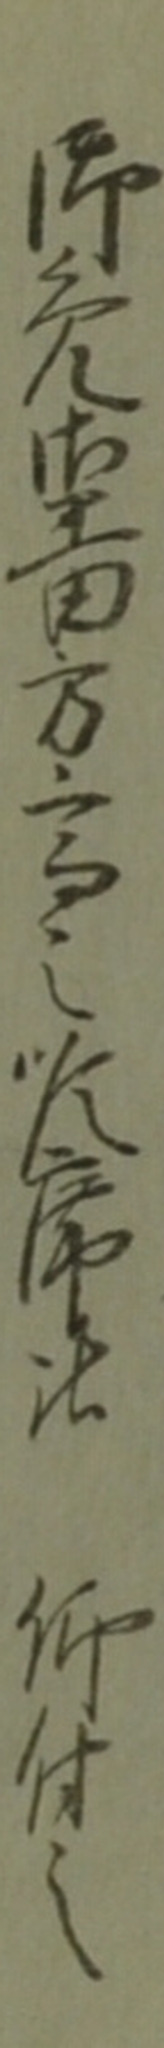御免御番形方高之順席被仰付之
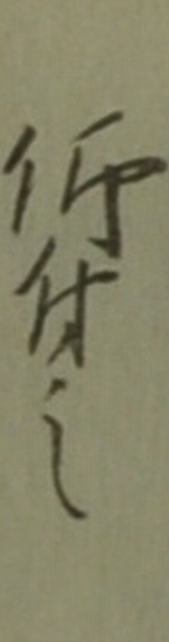仰付之
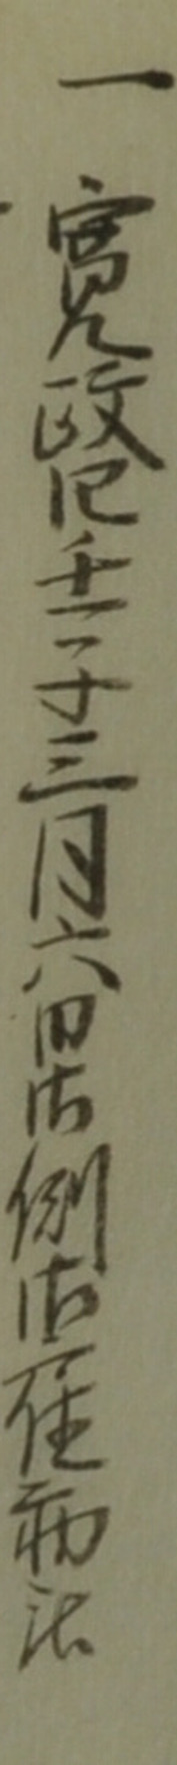一寛政四壬子三月六日御側御雇勤被
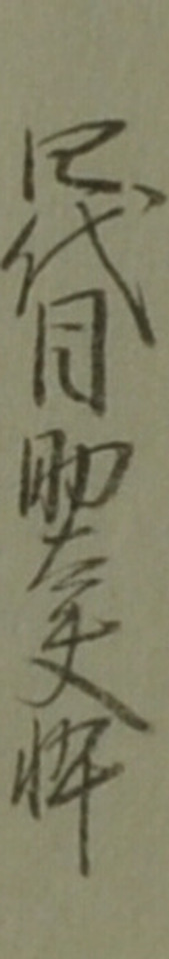四代目助太夫忰
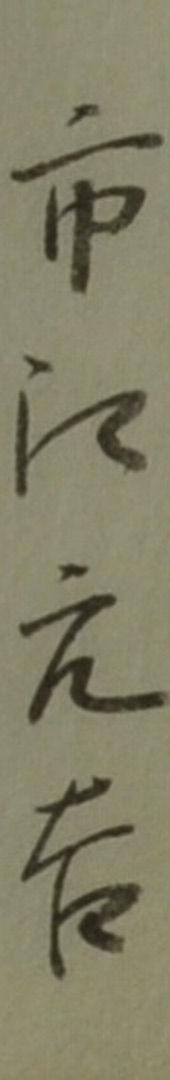市江元吉
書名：諸御役代々録（五）
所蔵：伊那市立高遠町図書館・合同会社AMANE
